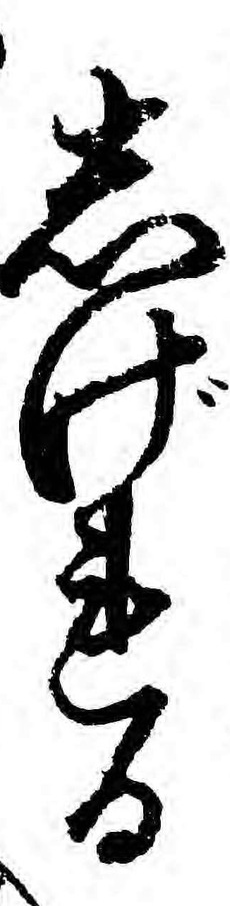しげれる
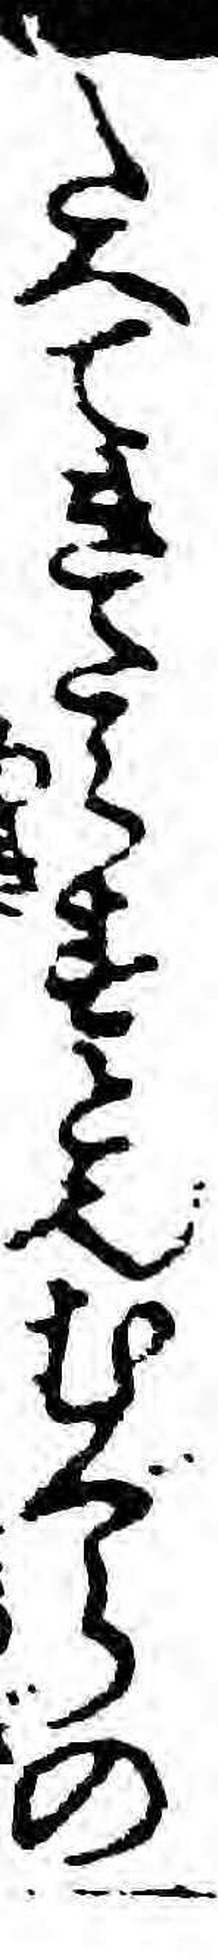たへてきたらすと也むぐらの
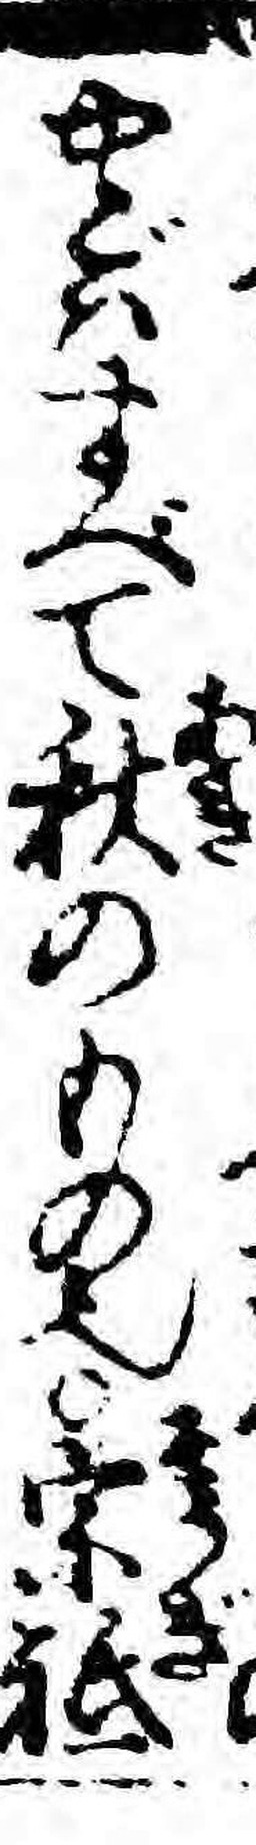やどはすべて秋のもの也〇宗祇
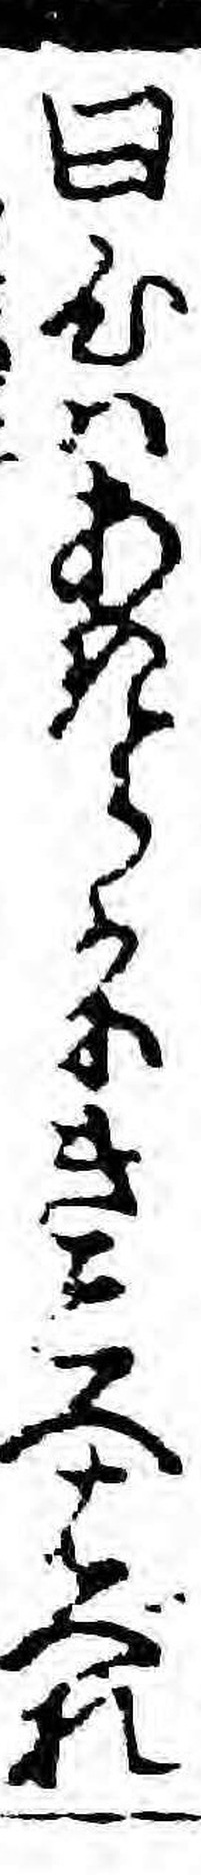曰心はあきらかにきこへはべれ
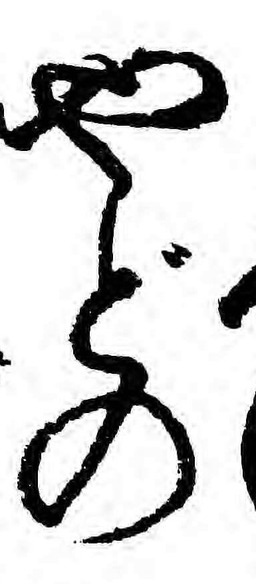やどの
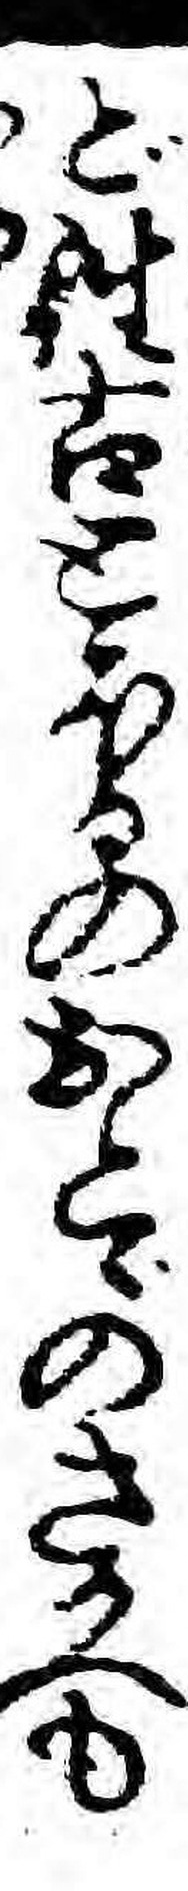ど往古とほるのおとゞのさかへも
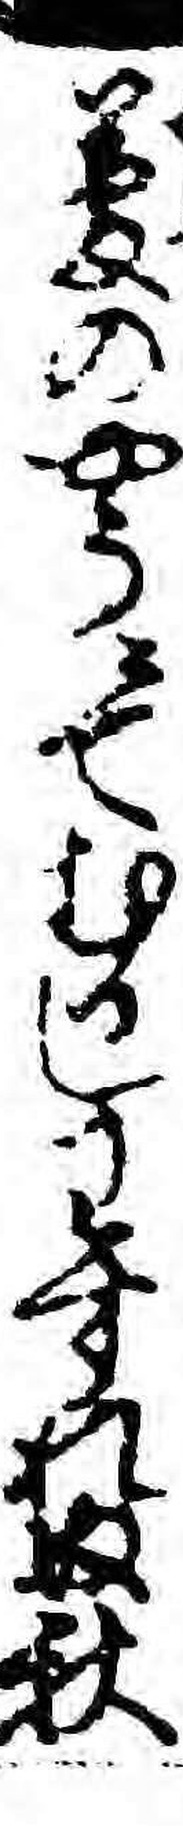夢のやうにてむかしわすれぬ秋
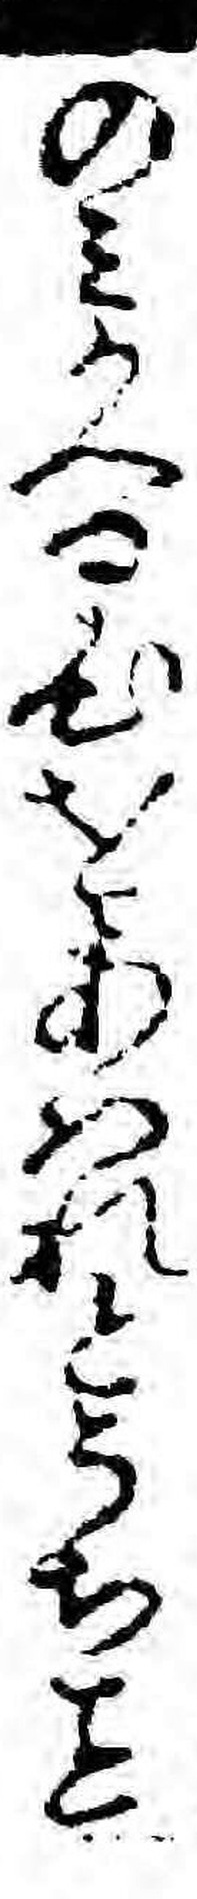のみかへる心をあはれとうちこと
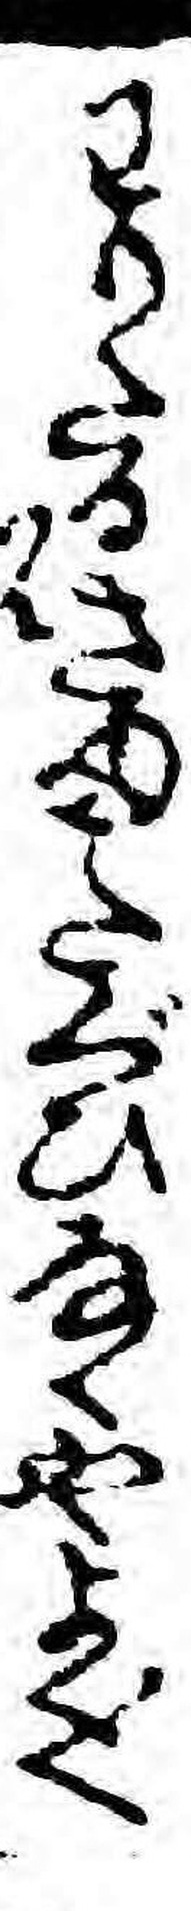わりたるさまたぐひなくやよく〳〵
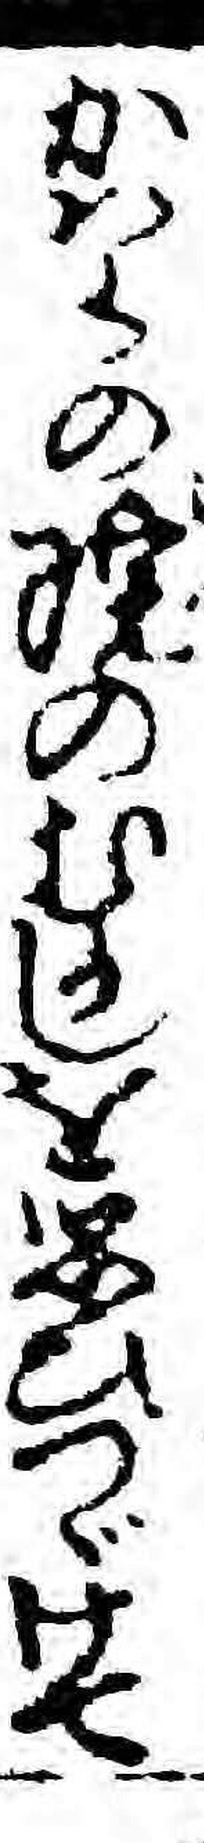かはらの院のむかしを思ひつゞけて
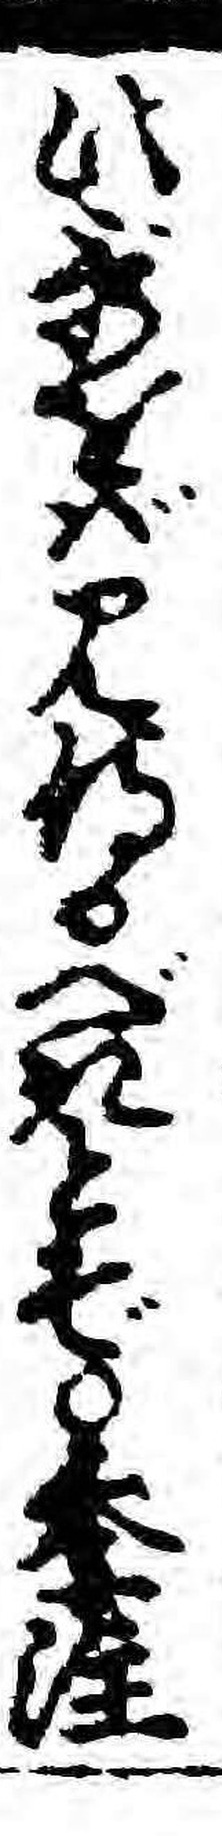此哥をば見侍るべきとぞ〇季注
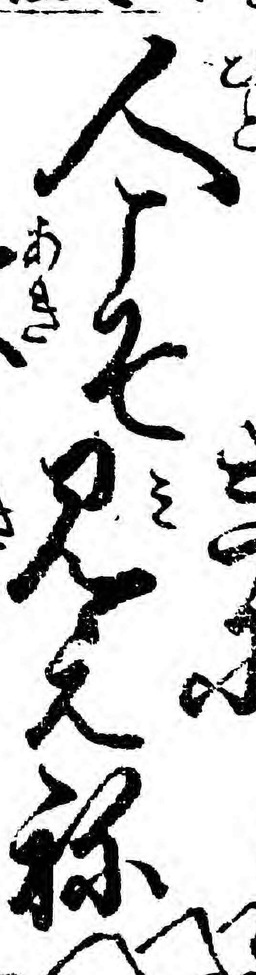人こそ見えね
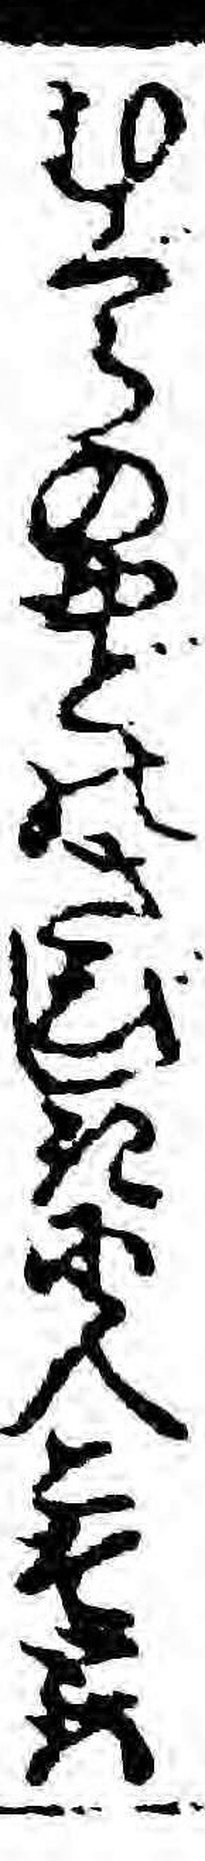むぐらのやどのさびしきに人こそとは
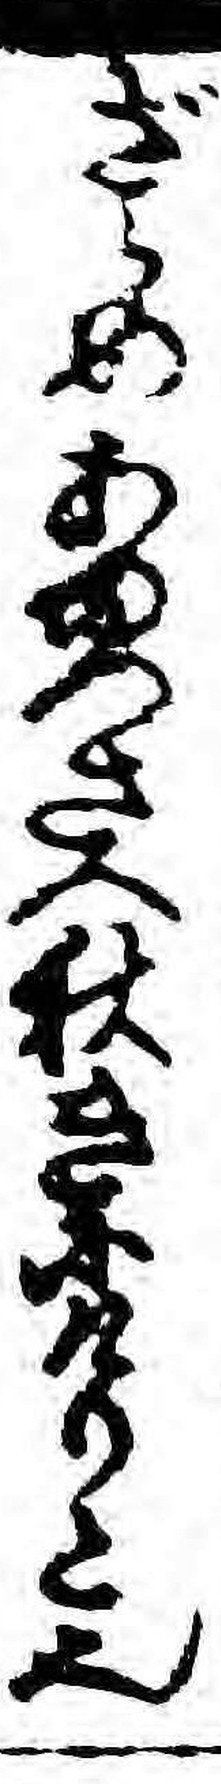ざらめあまつさへ秋きにけりと也
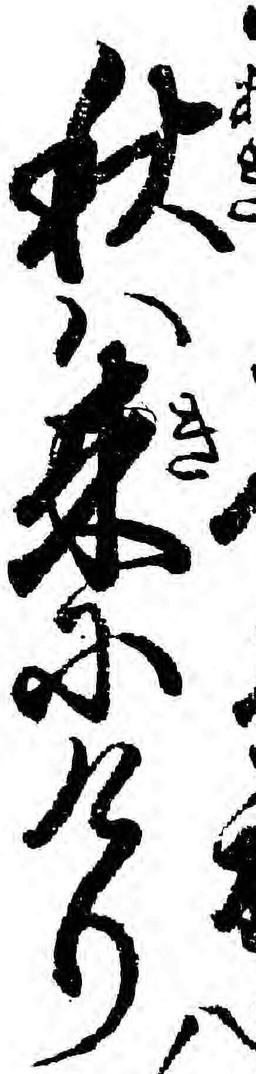秋は来にけり

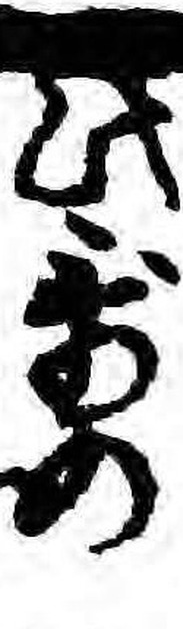此哥の
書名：頭書和歌注譯／壽賀多百人一首小倉錦
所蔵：国文学研究資料館
